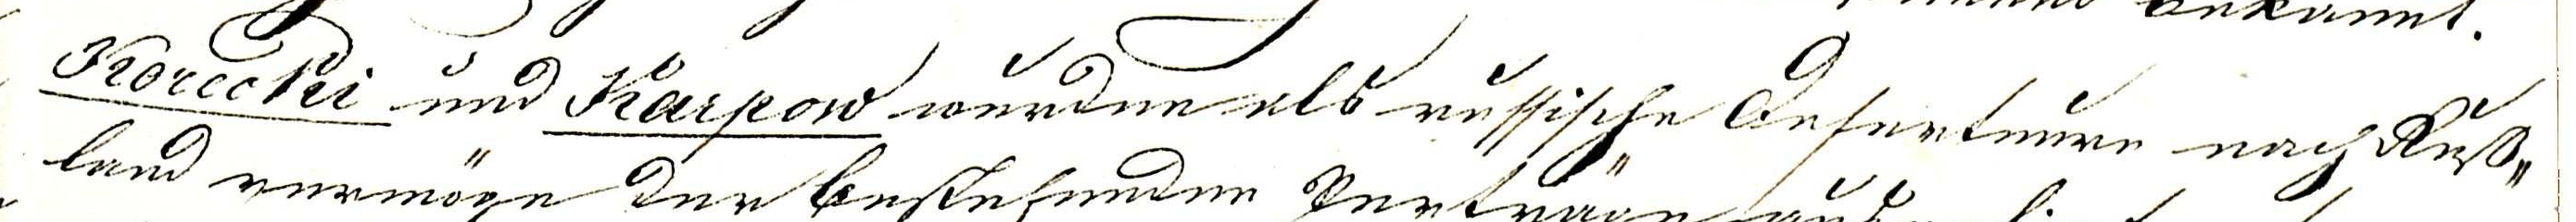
Korecki und Karpow wurden als russische Deserteure nach Ruß¬
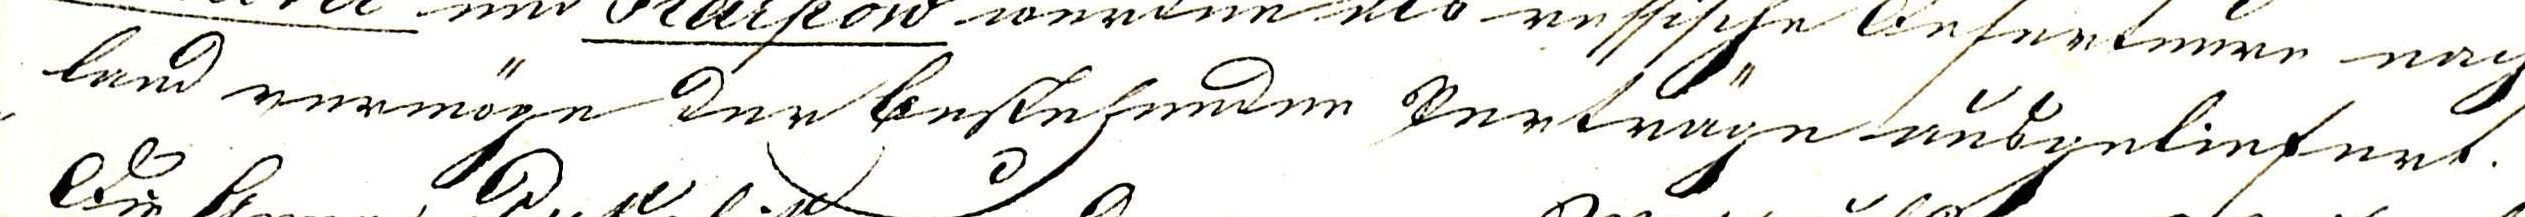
land vermöge der bestehenden Verträge ausgeliefert.
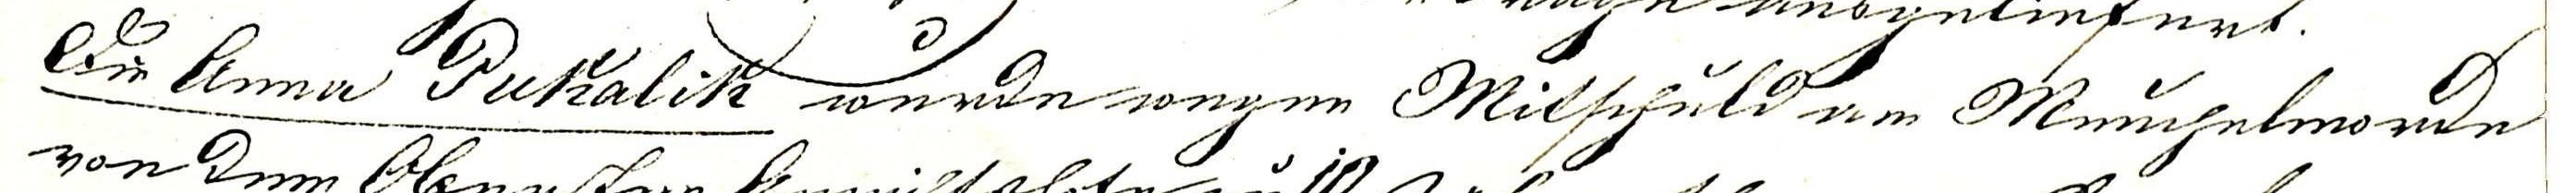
Die Anna Pukalik wurde wegen Mitschuld am Meuchelmorde
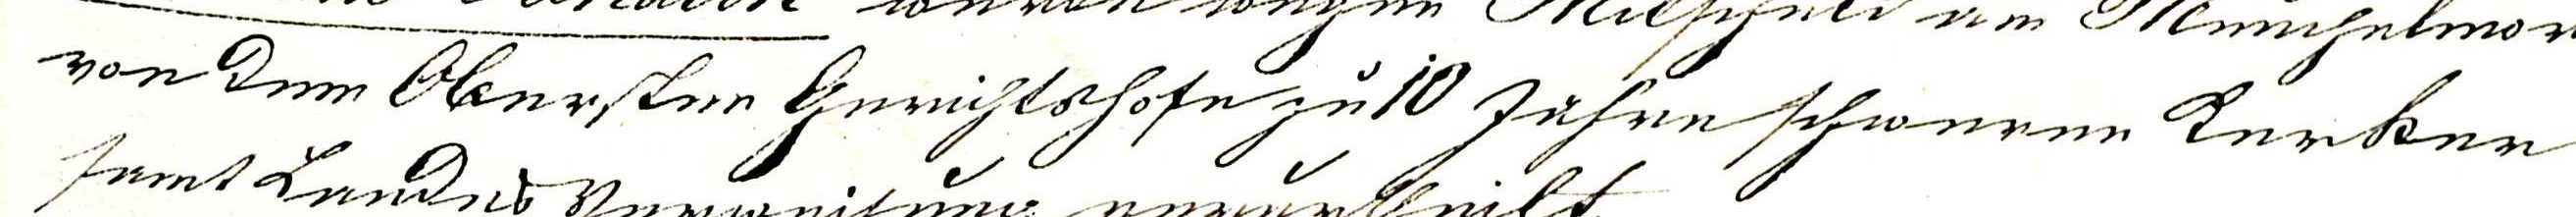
von dem Obersten Gerichtshofe zu 10 Jahre schweren Kerker
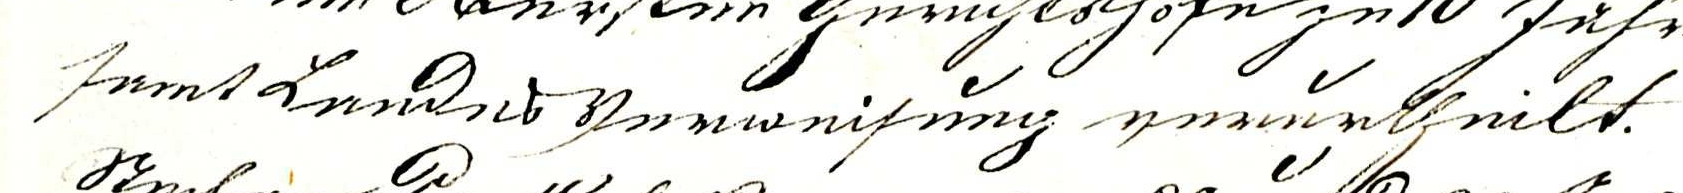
samt Landes Verweisung verurtheilt.
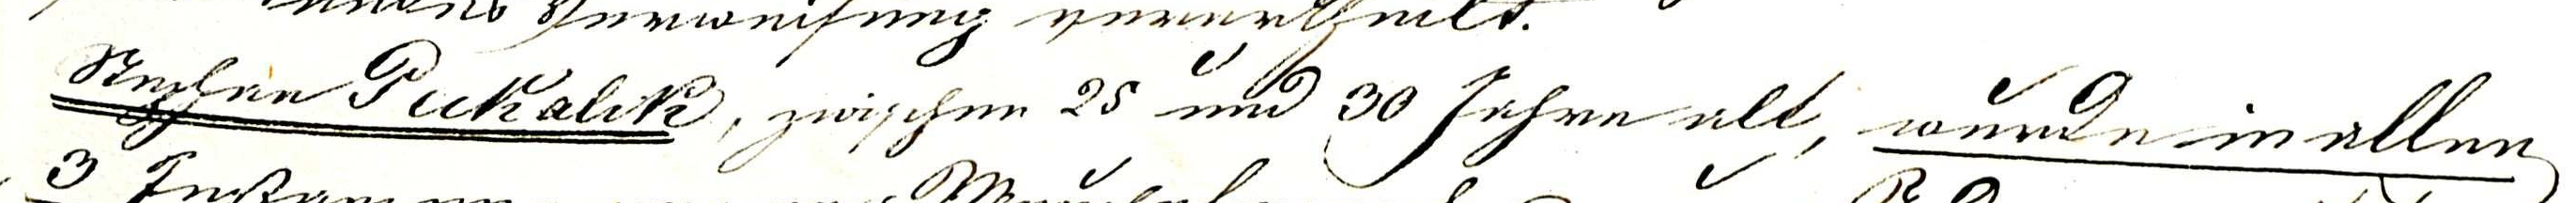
Stephan Pukalik, zwischen 25 und 30 Jahre alt, wurde in allen
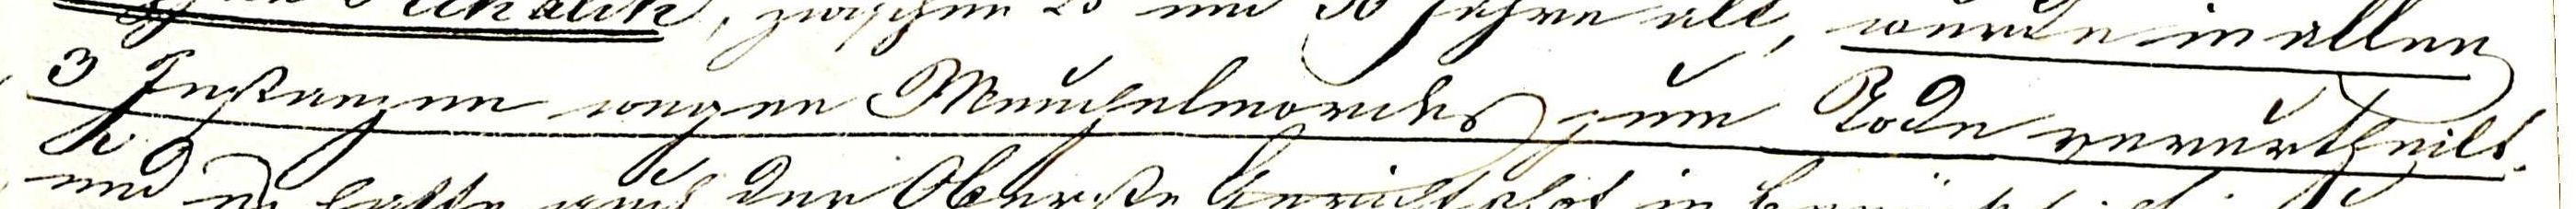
3 Jnstanzen wegen Meuchelmordes zum Tode verurtheilt.
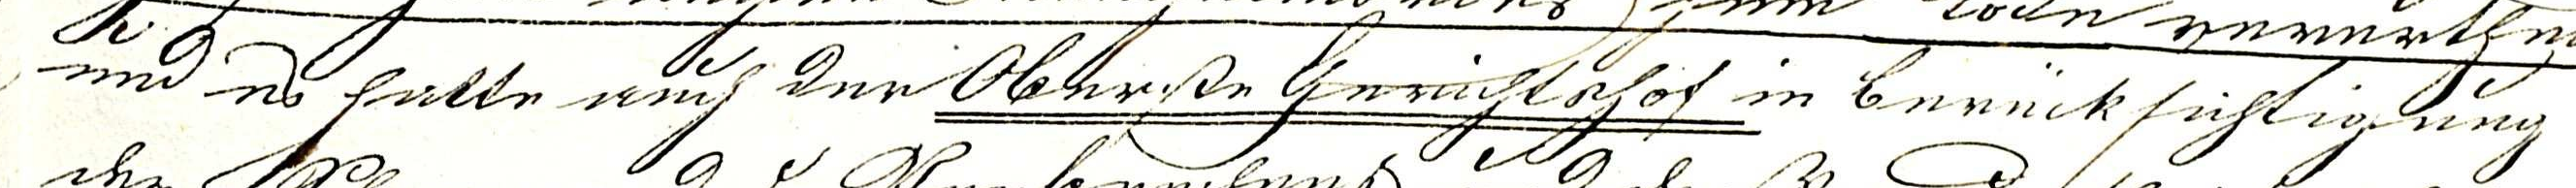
und es hatte auch der Oberste Gerichtshof in Berücksichtigung
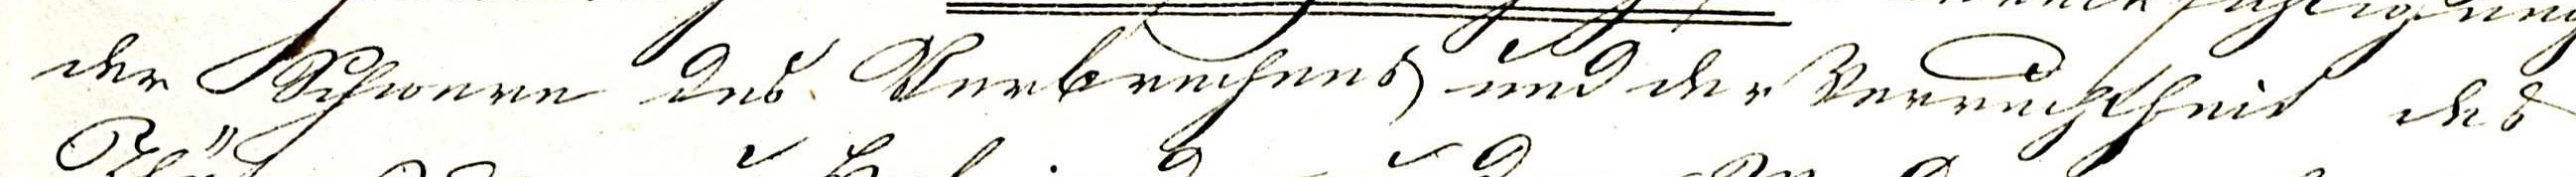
der Schwere des Verbrechens und der Verruchtheit des
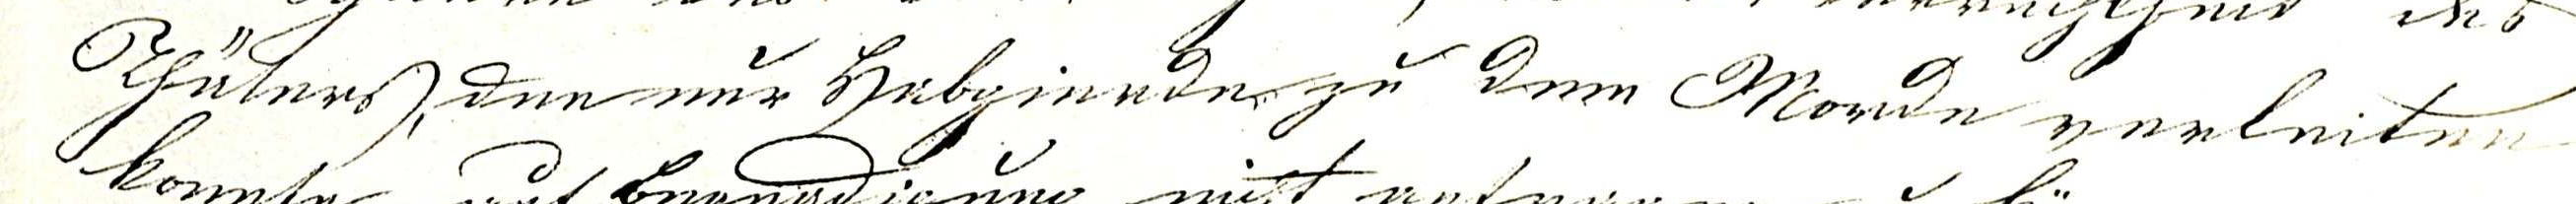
Thäters, den nur Habxx zu dem Morde verleiten
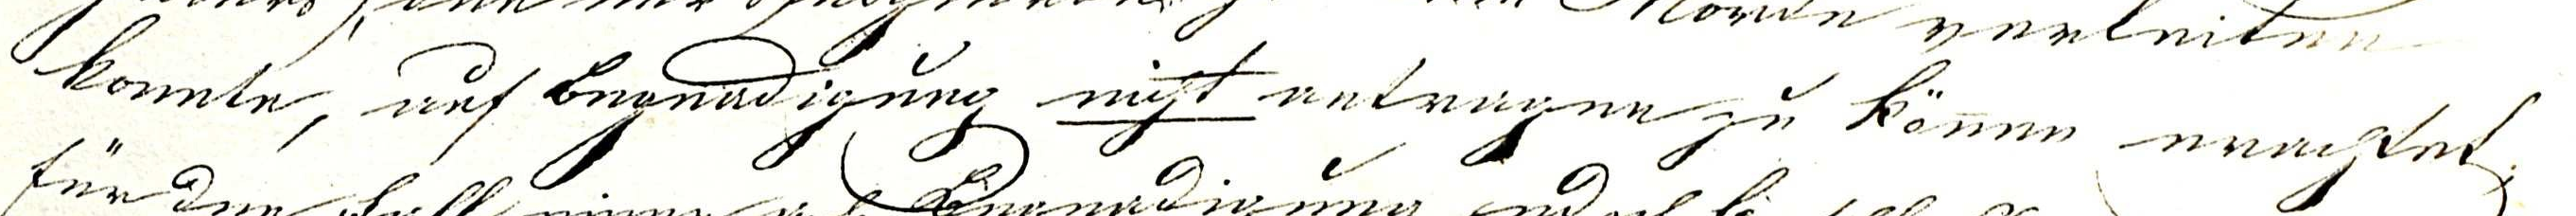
konnte, auf Begnadigung nicht antragen zu können erachtet;
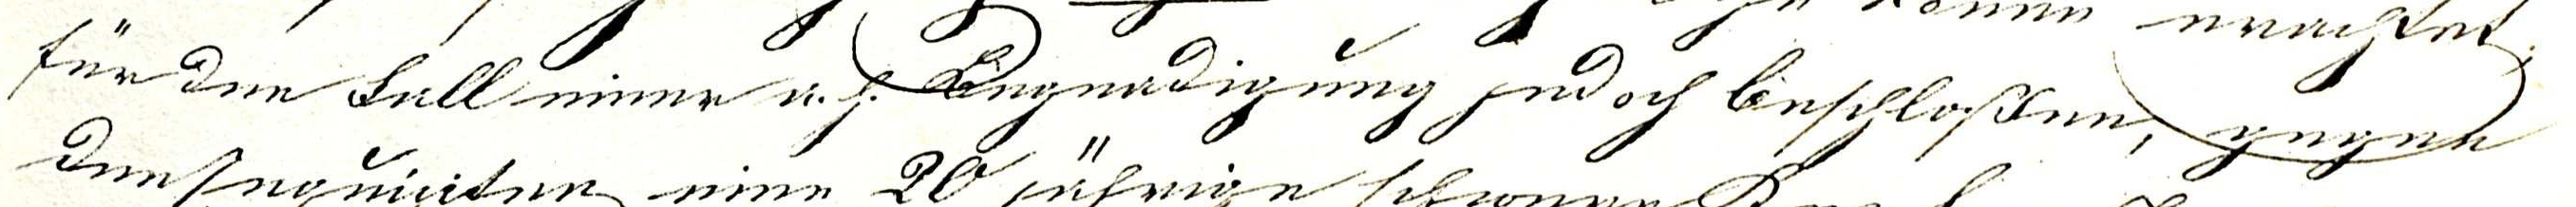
für den Fall einer a. h. Begnadigung jedoch beschloßen, gegen
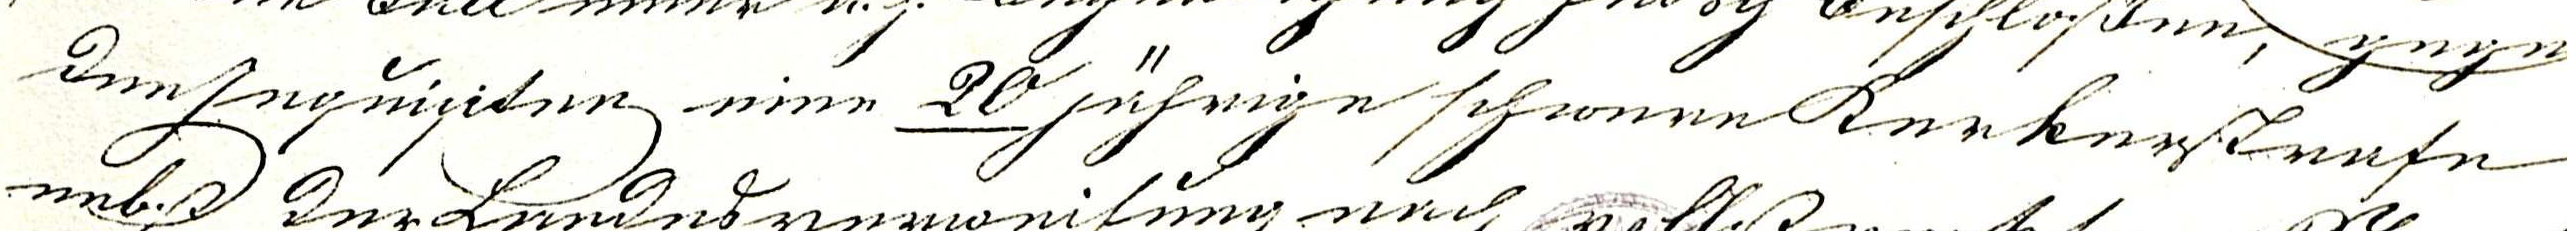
den Jnquisiten eine 20 jährige schwere Kerkerstrafe
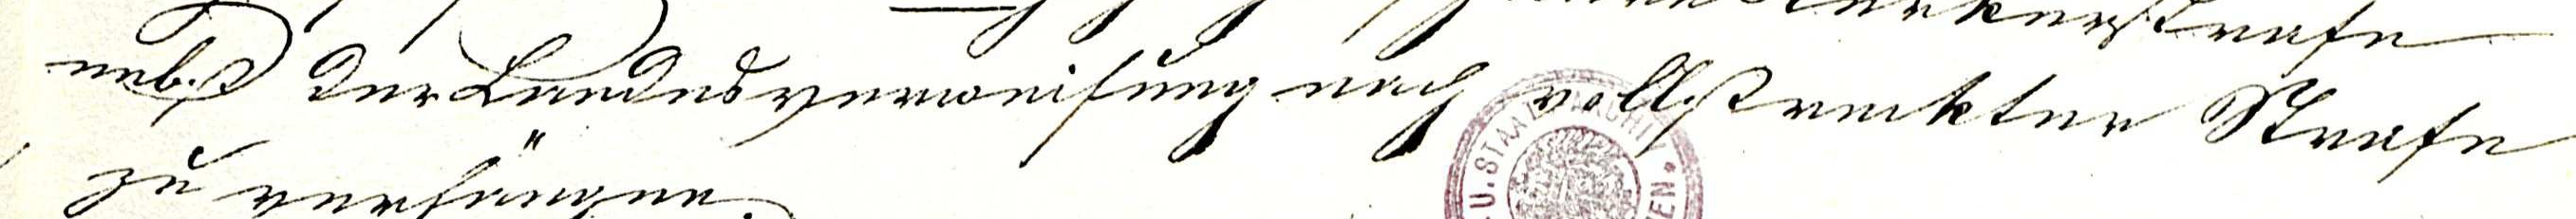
nebst der Landesverweisung nach vollstreckter Strafe
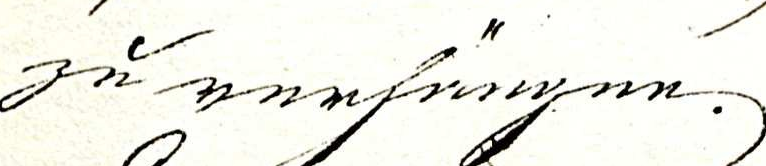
zu verhängen.
